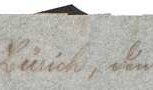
den 3.
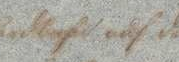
Hochverehrter
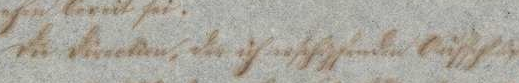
wünschen von mir zu erfahren, ob die Direction
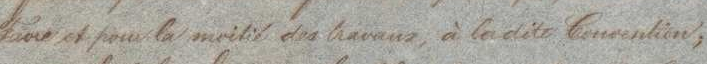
Favre et pour la moitié des travaux, à la dite Convention;
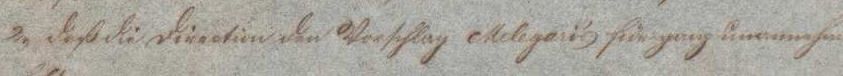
2., daß die Direction den Vorschlag Melegari's für ganz unannehm-
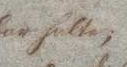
bar halte;
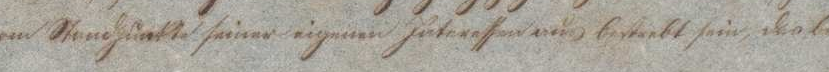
vom Standpunkte seiner eigenen Interessen aus bestrebt sein, das
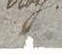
bei
